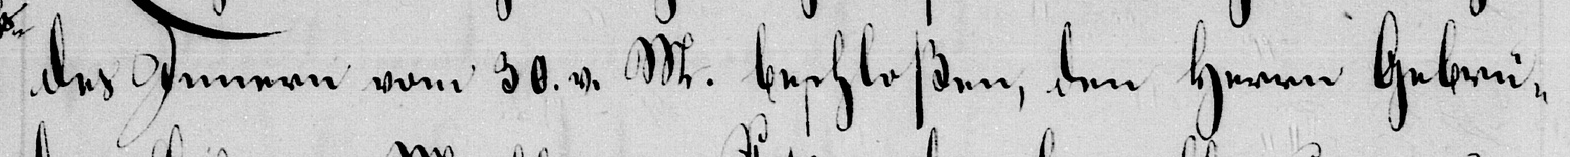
des Innern vom 30. v. M. beschloßen, den Herren Gebrü¬
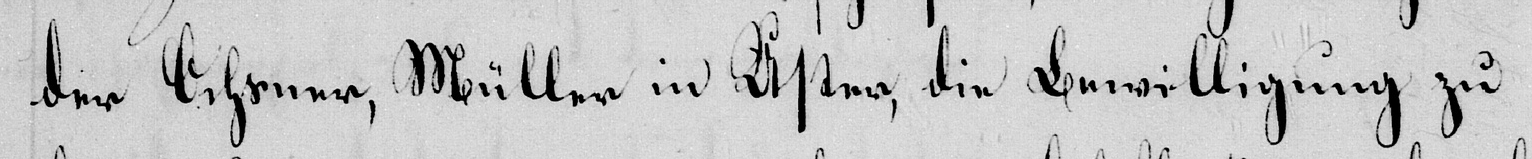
der Ochsner, Müller in Uster, die Bewilligung zu
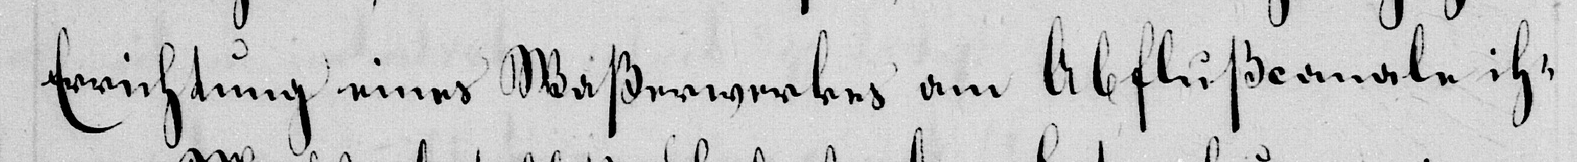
Errichtung eines Waßerwerkes am Abflußcanale ih¬
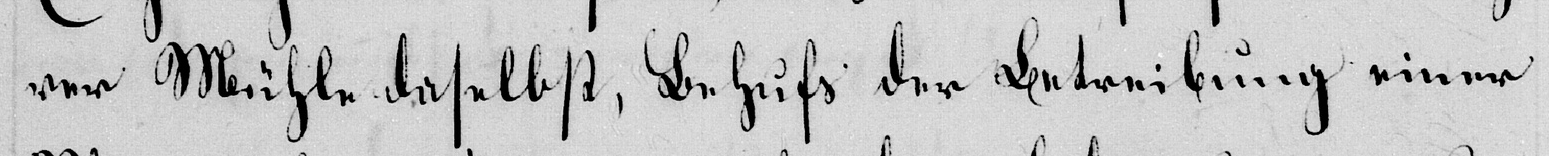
rer Mühle daselbst, Behufs der Betreibung einer
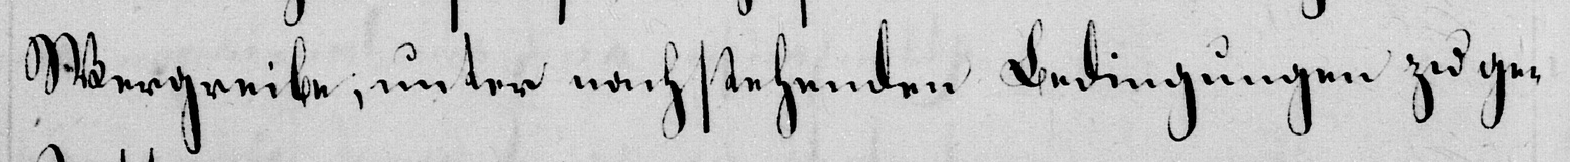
Wergreibe, unter nachstehenden Bedingungen zu ge¬
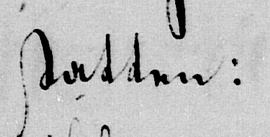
statten:
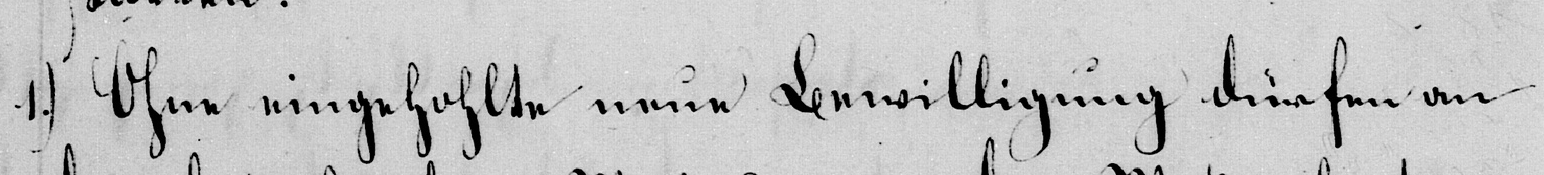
1.) Ohne eingehohlte neue Bewilligung dürfen an
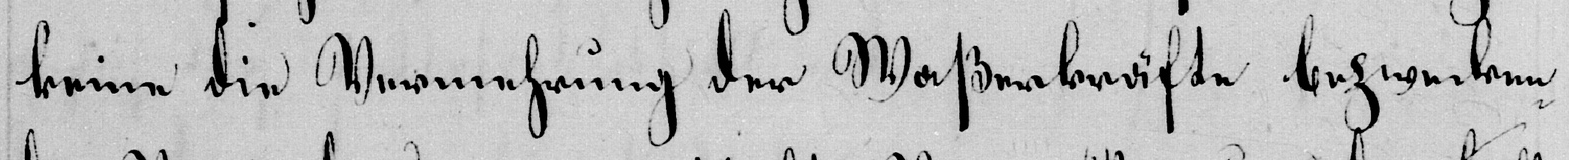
keine die Vermehrung der Waßerkräfte bezwecken¬
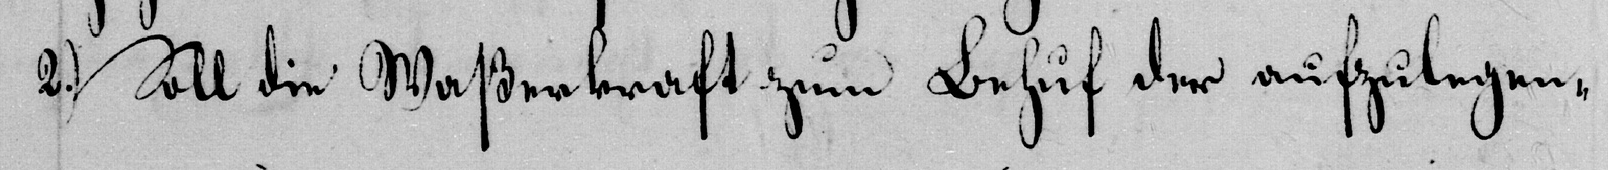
2.) Soll die Waßerkraft zum Behuf der aufzulegen-
